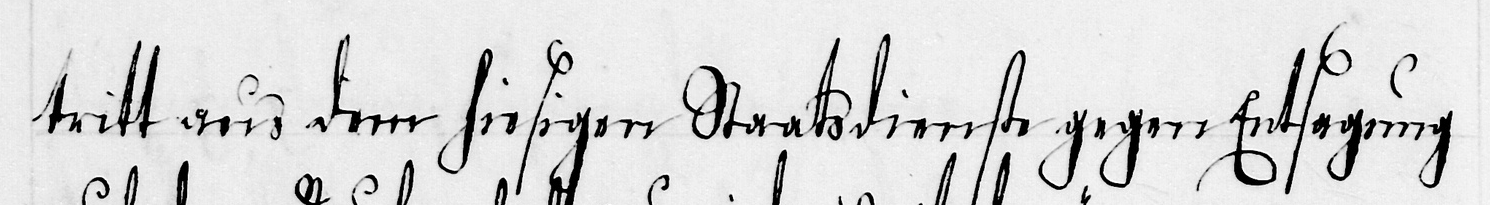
tritt aus dem hiesigen Staatsdienste gegen Entsagung
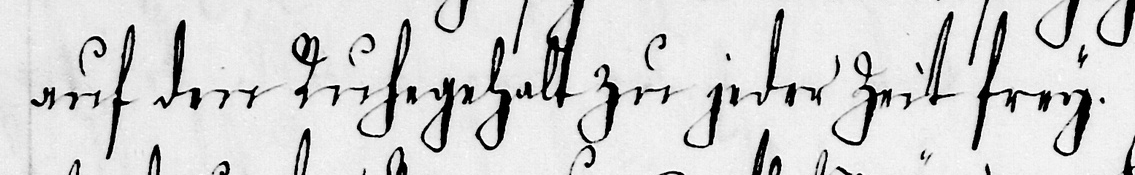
auf den Ruhegehalt zu jeder Zeit frey.
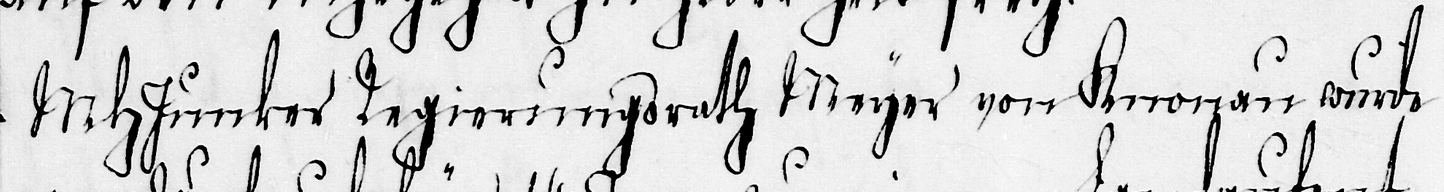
MH Junker Regierungsrath Meyer von Knonau wurde
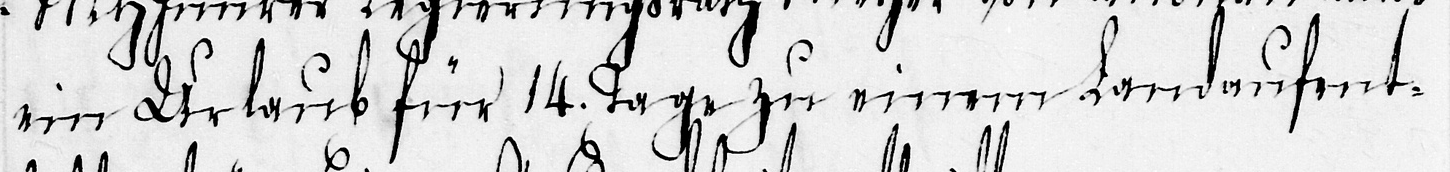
ein Urlaub für 14. Tage zu einem Landaufent¬
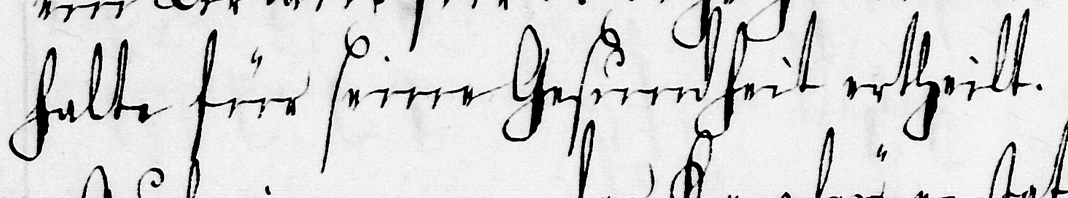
halte für seine Gesundheit ertheilt.
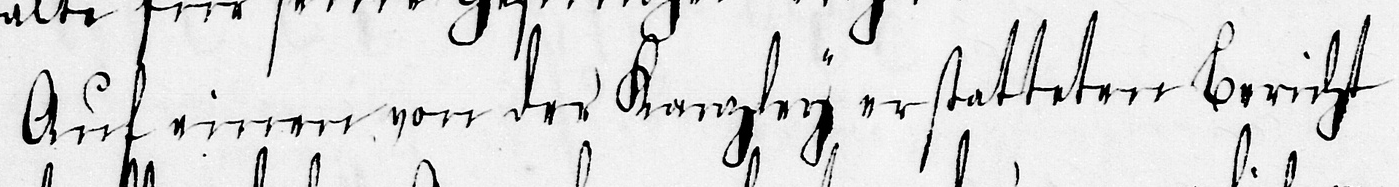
Auf einen von der Kanzley erstatteten Bericht
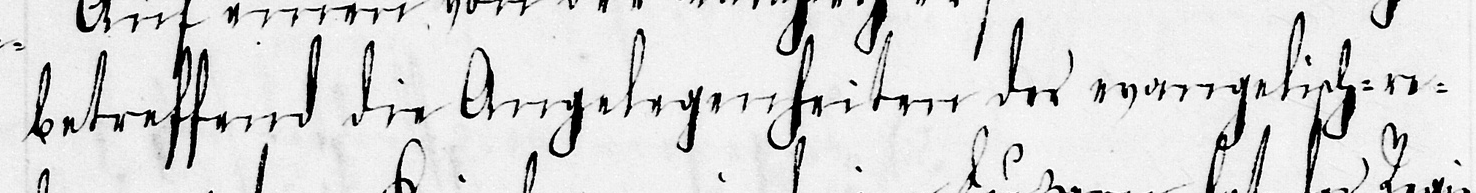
betreffend die Angelegenheiten der evangelisch-re¬
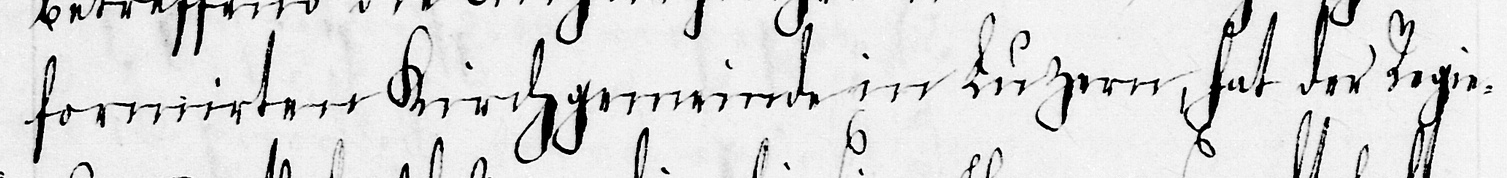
formirten Kirchgemeinde in Luzern, hat der Regie¬
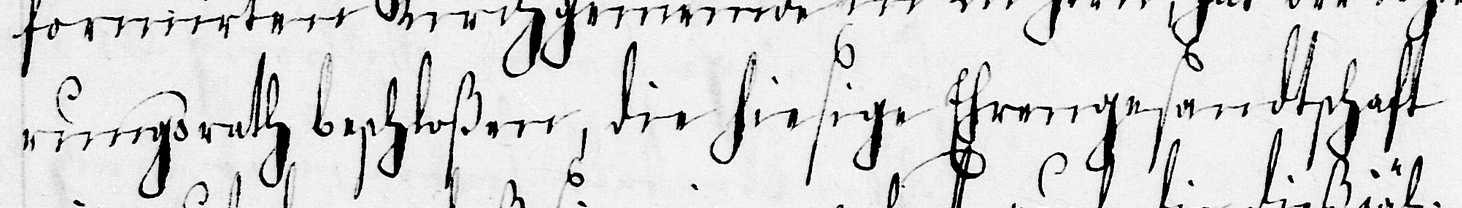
rungsrath beschloßen, die hiesige Ehrengesandtschaft
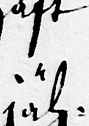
14.
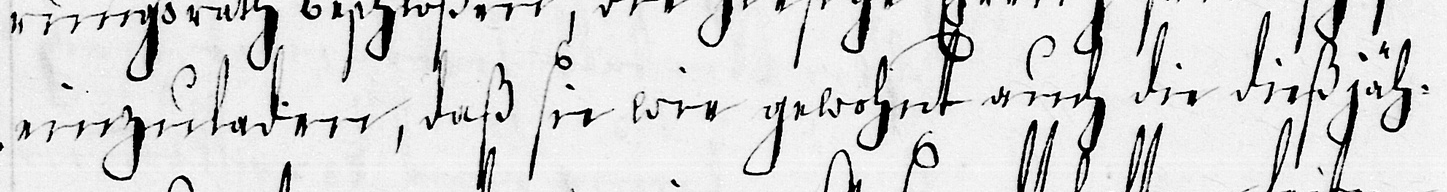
einzuladen, daß sie wie gewohnt auch die dießjäh¬
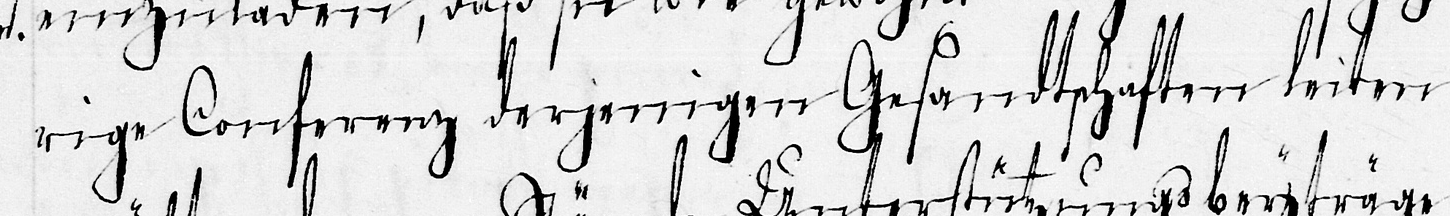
rige Conferenz derjenigen Gesandtschaften leiten
